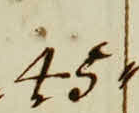45
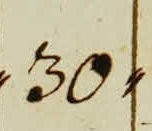30
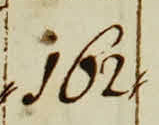162
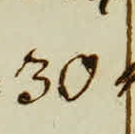30
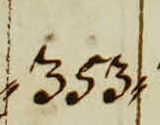353
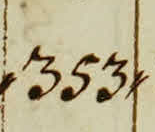353
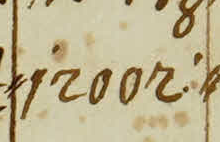12002
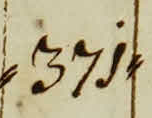371
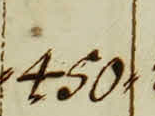450
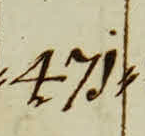471
